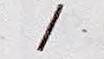1
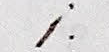1.
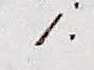1
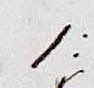1
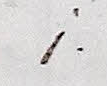1
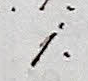1
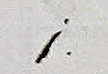1.
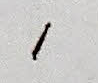1
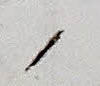1
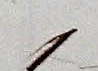1
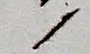1
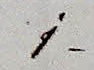1
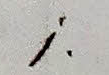1.
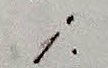1.
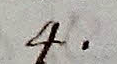4.
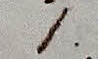1
